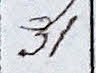31
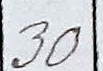30
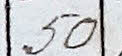50
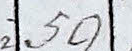59
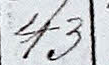43
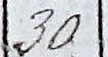30
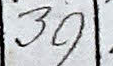39
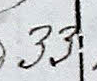33
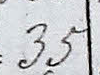35
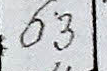63
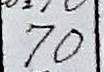70
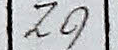29
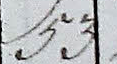53
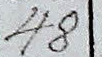48
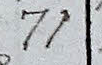71
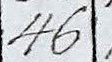46
